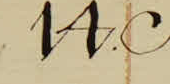14.
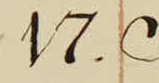17.
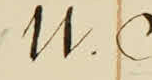11.
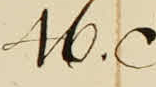46.
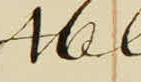46.
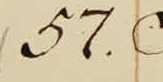57.
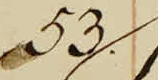53.
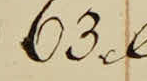63.
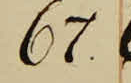67.
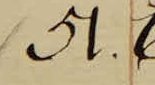51.
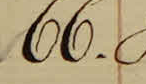66.
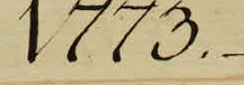1773.
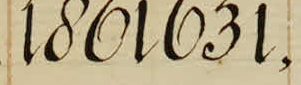1861631
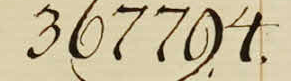367794.
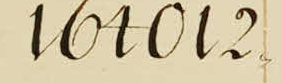164012
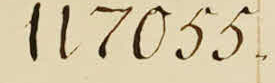117055
